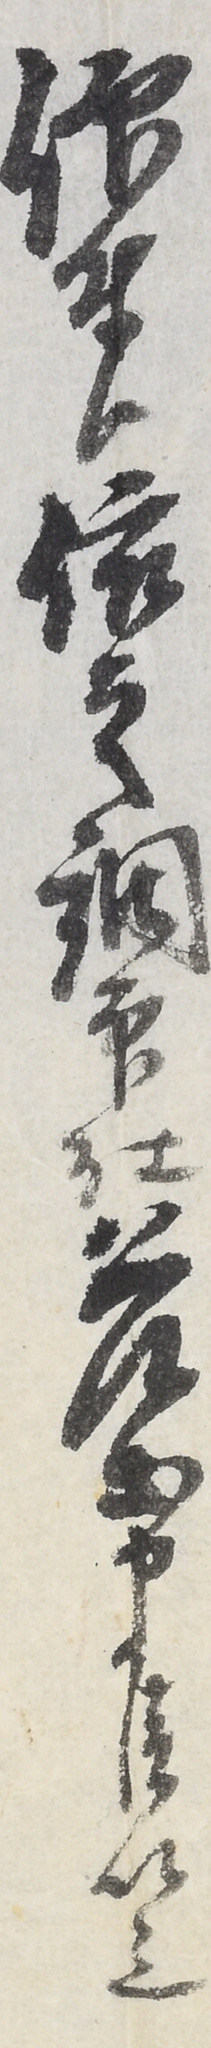仰付候依之調印仕差出申候以上

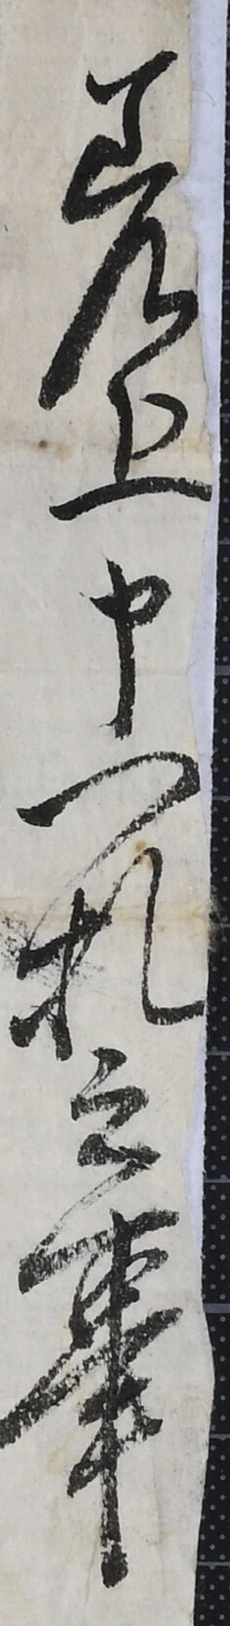差上申一札之事
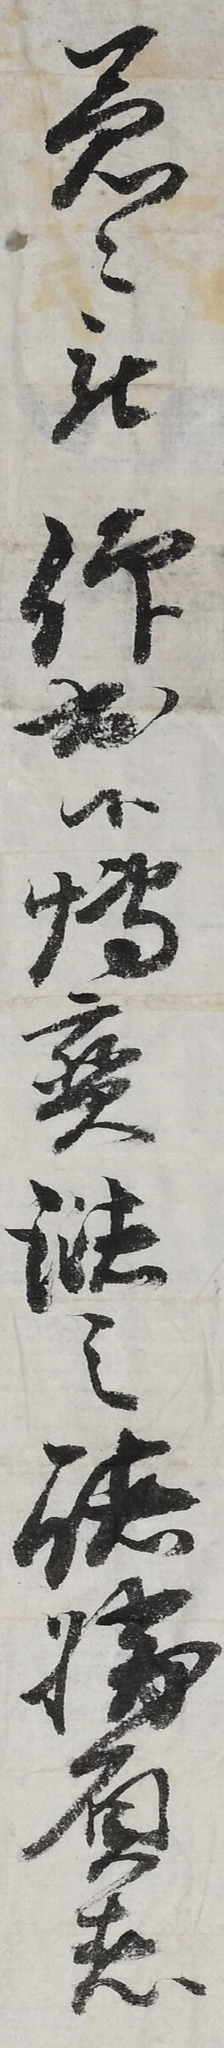兼々被仰出候博奕賭之諸勝負者
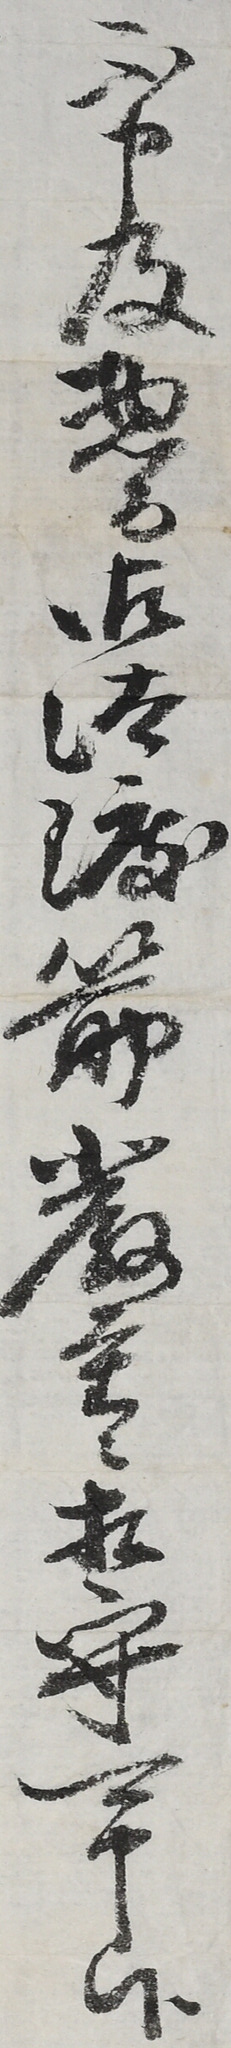不申及惣而御沙汰筋厳重ニ相守可申候
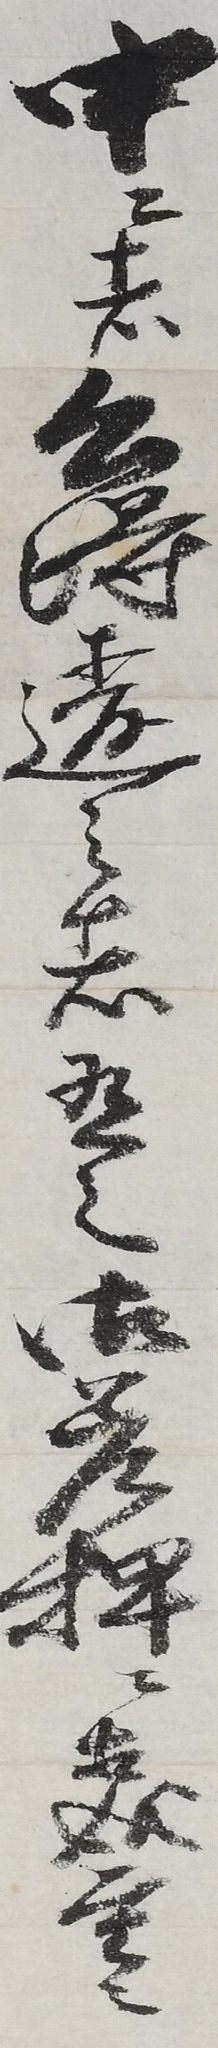中ニ者心得違之者有之御差押ニ相成重々
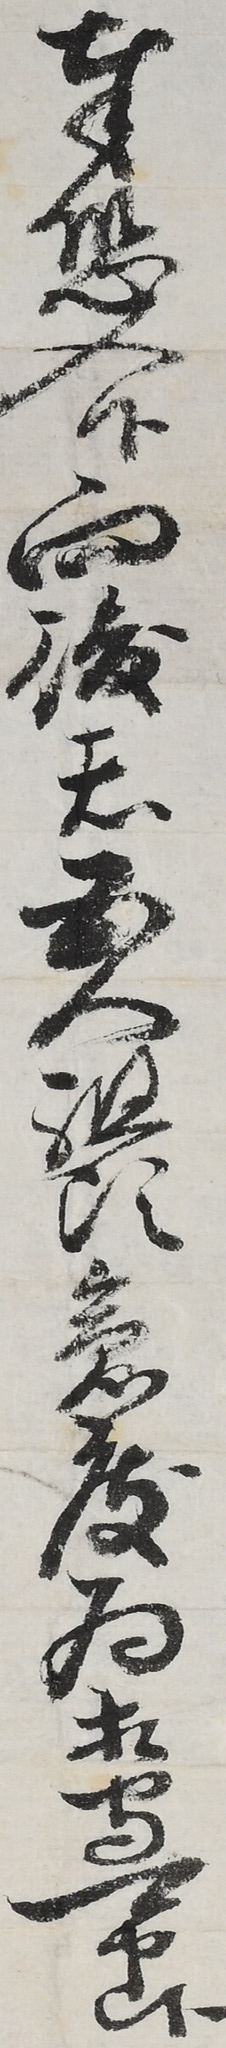奉恐入候向後者五人組頭急度為相守可申候
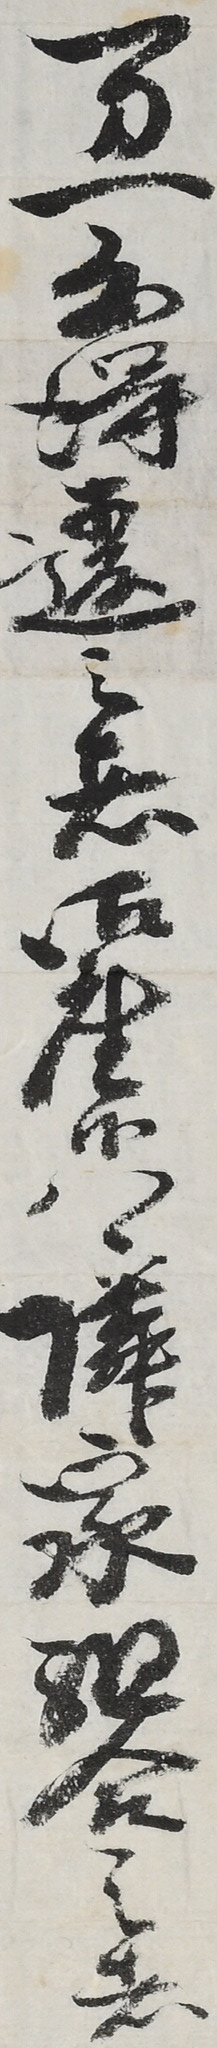万一心得違之者御座候ハゝ隣家組合之者
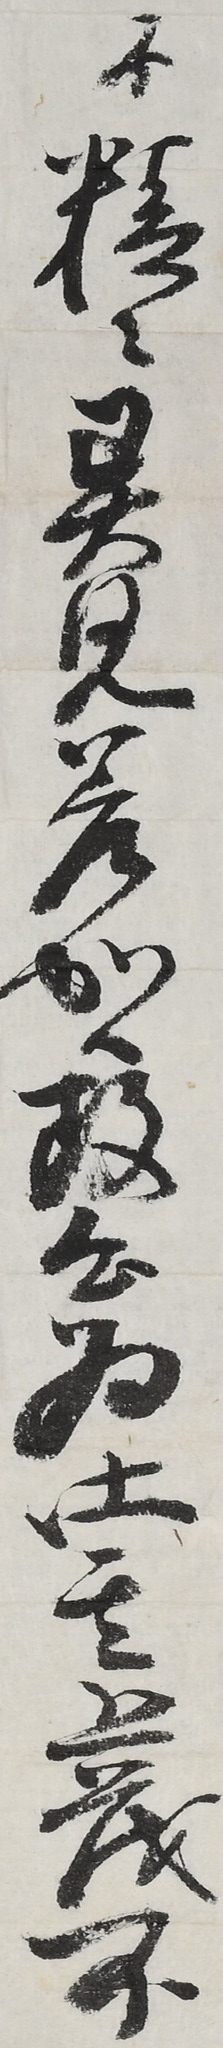ゟ精々異見差加へ改心為仕其上茂可
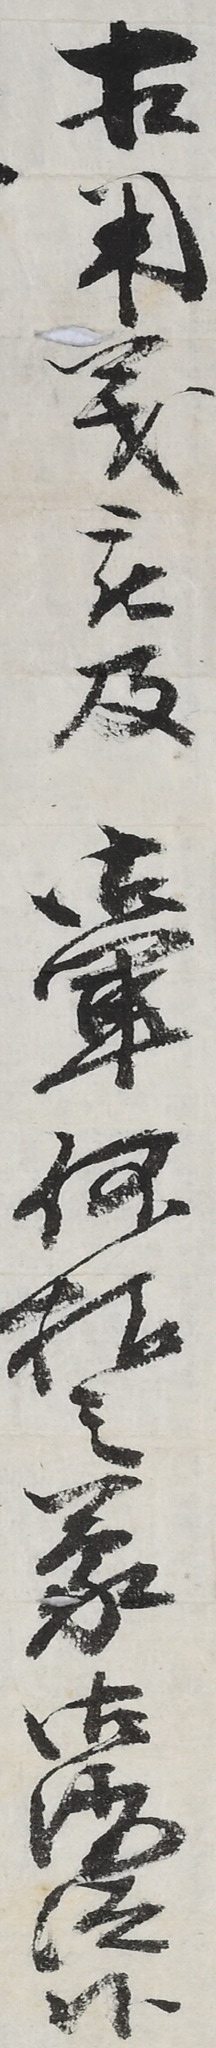相用義被及御聞何様之蒙御沙汰候
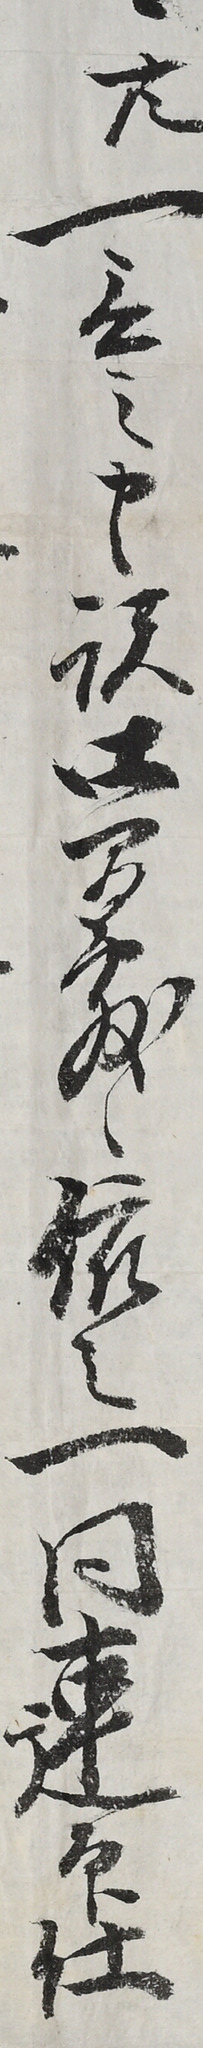共一言之申訳仕間敷候依之一同連印仕
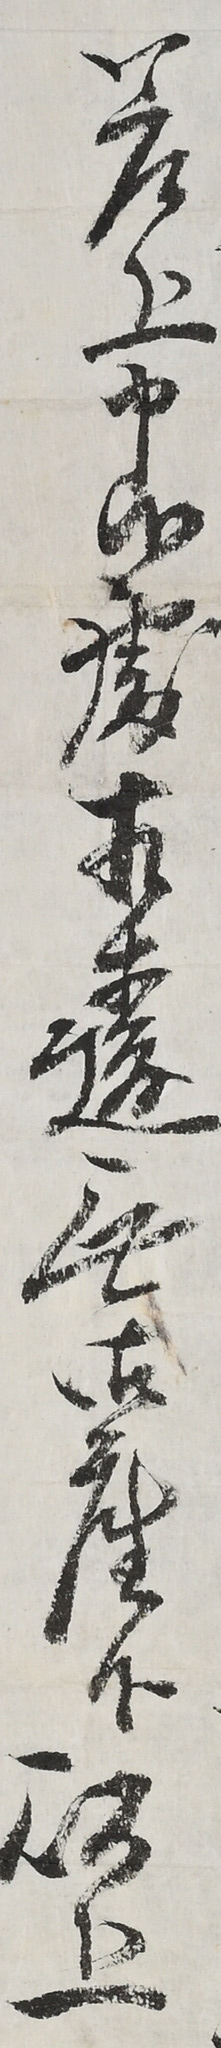差上申候処相違無御座候以上
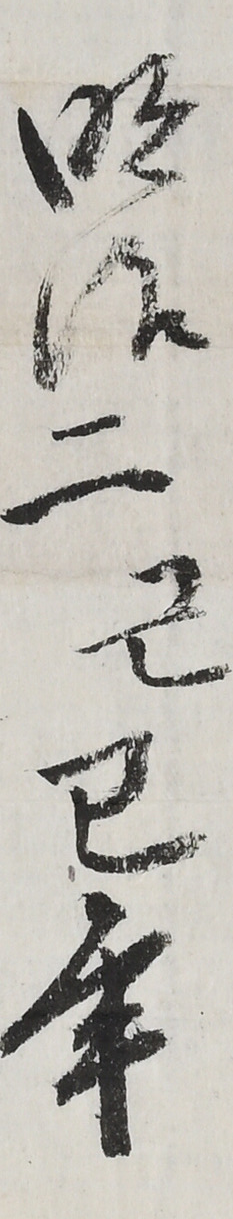明治二己巳年
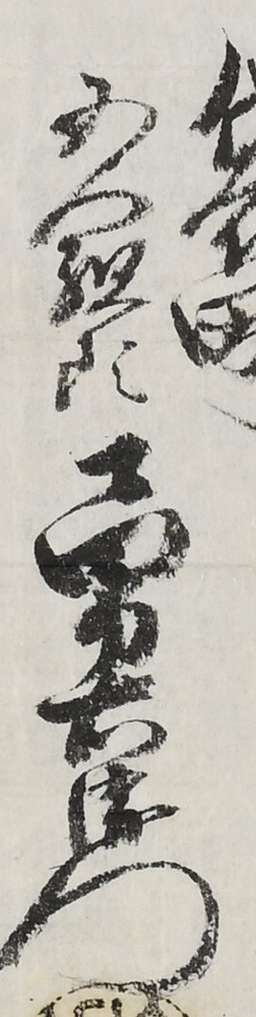五人組頭勇右衛門㊞
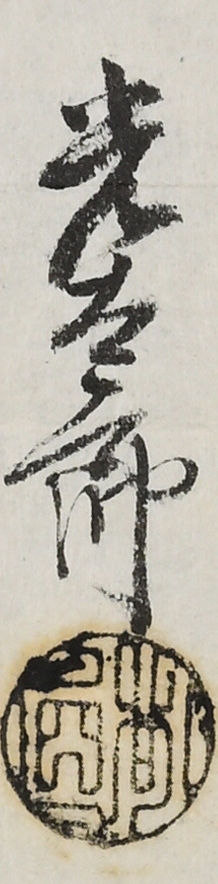光太郎㊞
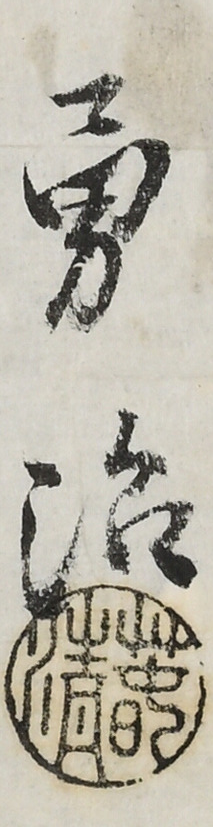勇治㊞
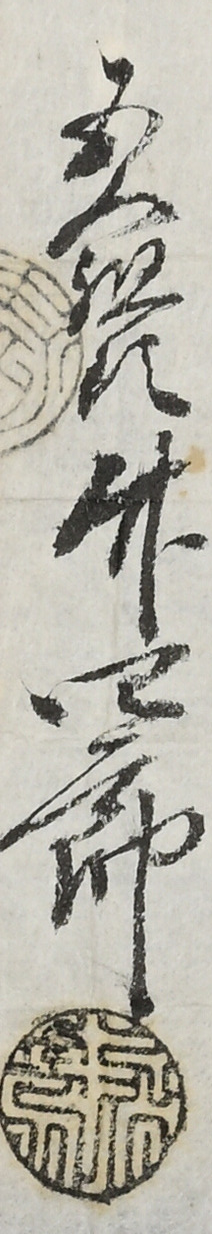五人組頭竹四郎㊞
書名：差上申一札之事
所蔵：伊那市立高遠町図書館・合同会社AMANE
